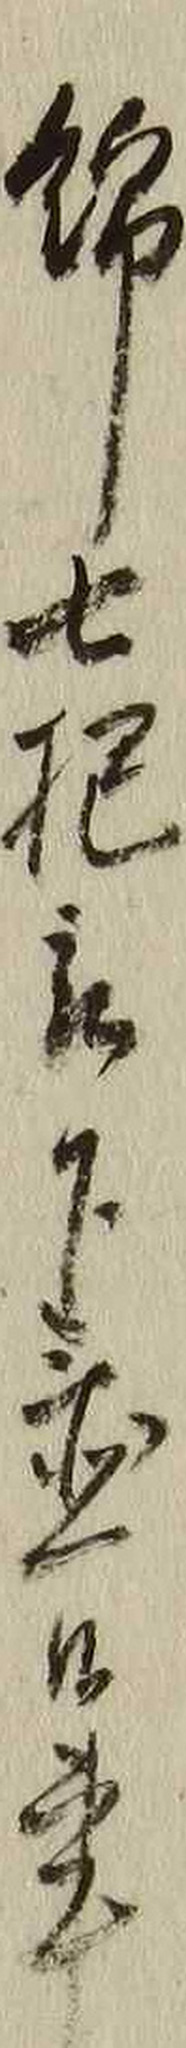綿七把被下置候事
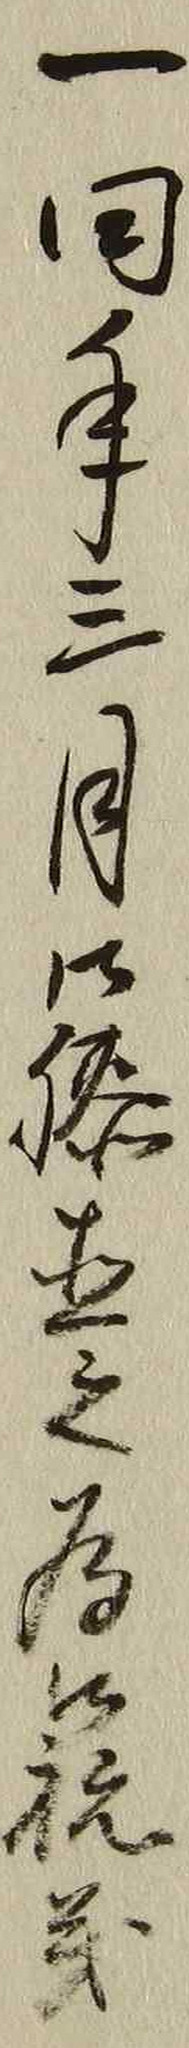一同年三月御膝直之為御祝義
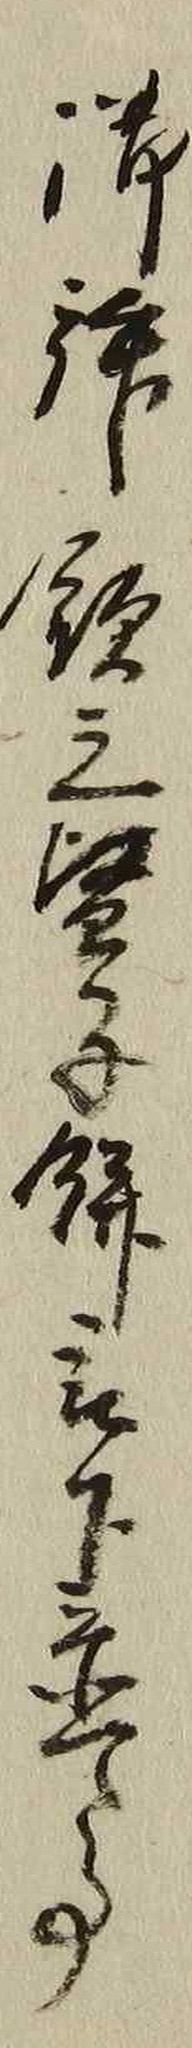御拝領之皆子餅被下置候事
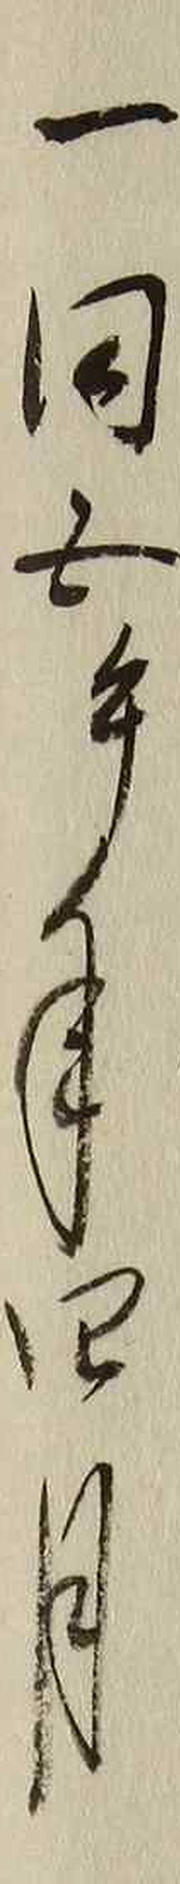一同五午年四月
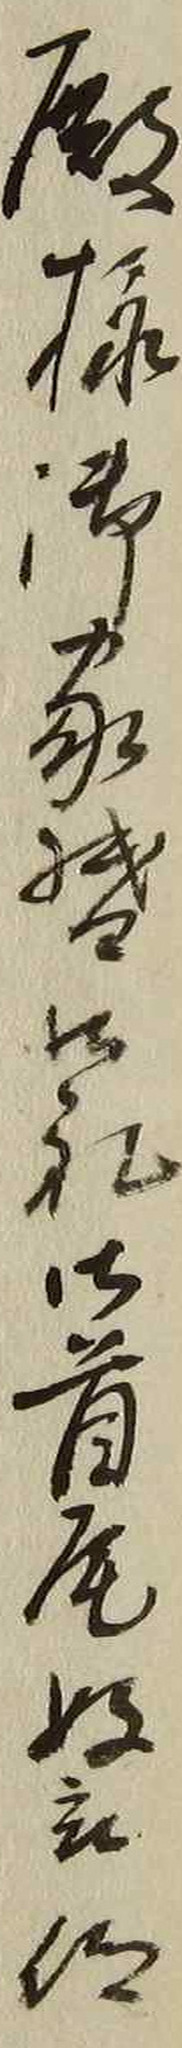殿様御家督御礼御首尾好被仰
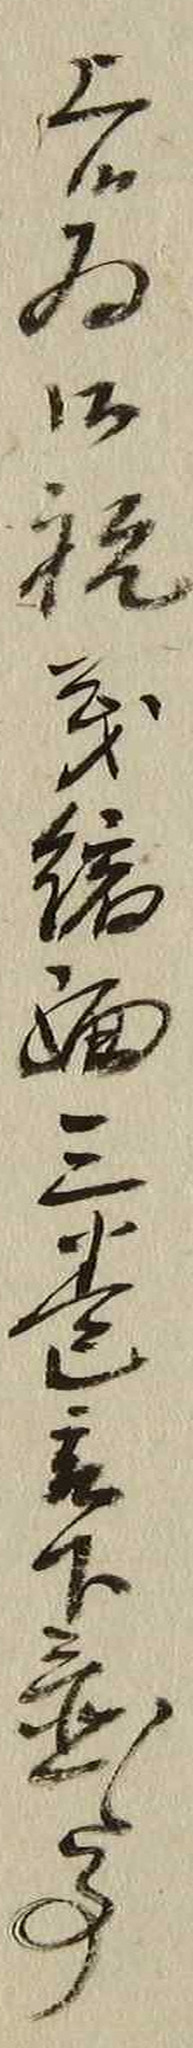上候為御祝義縮緬三巻被下置候事
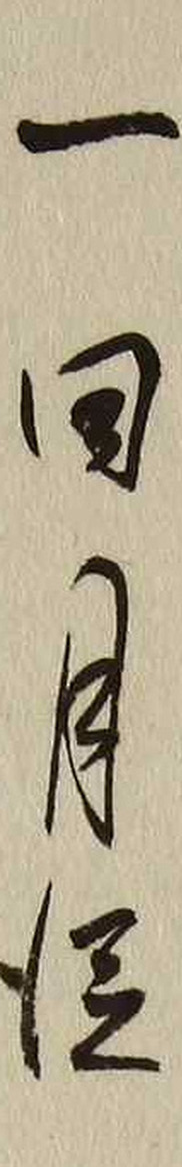一同月従
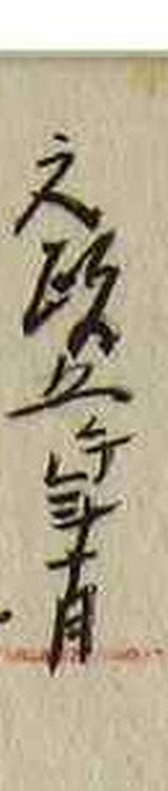文政五午年十月
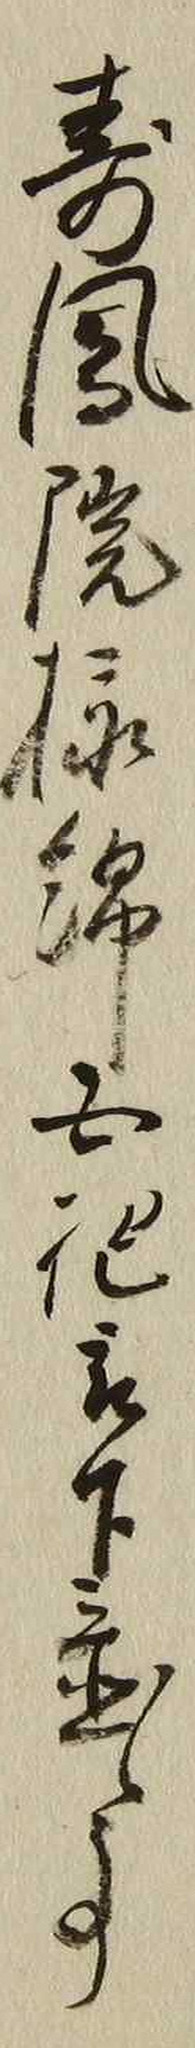寿鳳院様綿五把被下置候事
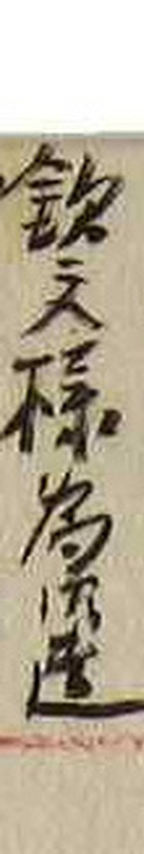欽文様為御遺
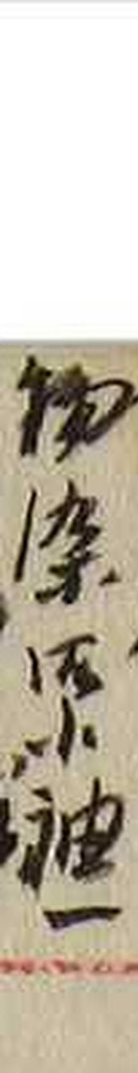物染御小袖一
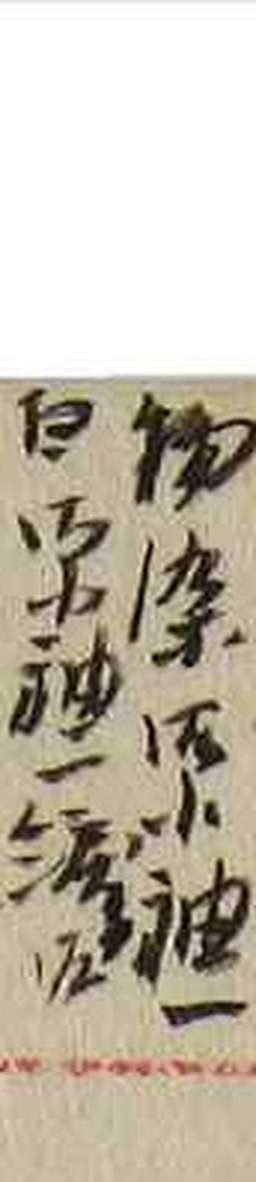白御小袖一綟御
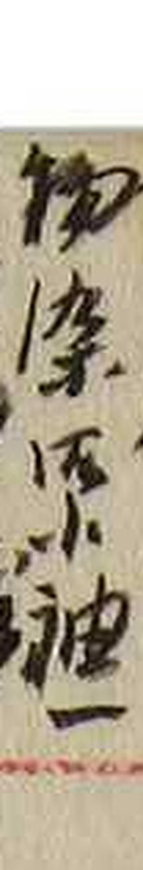物染御小袖一
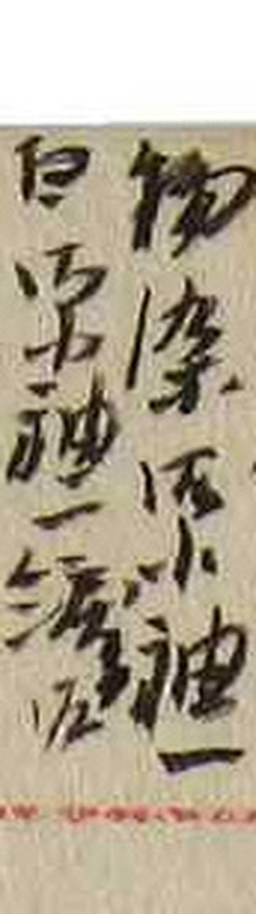白御小袖一綟御
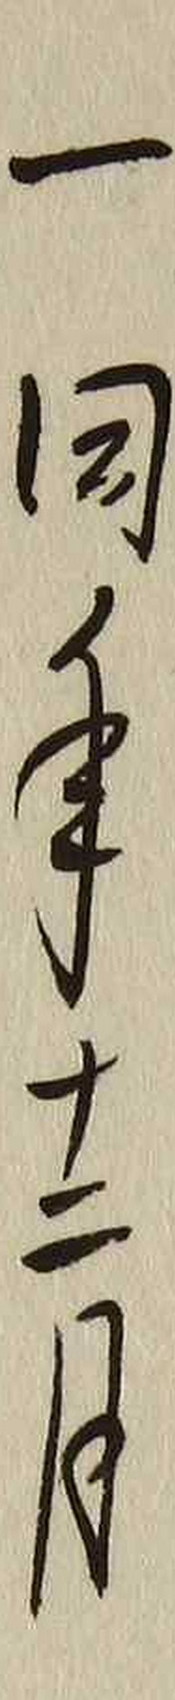一同年十二月
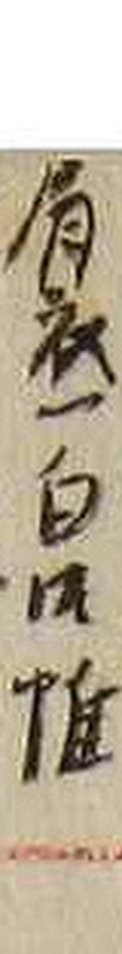肩衣一白御帷
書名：諸士系譜　巻之351　す之部1
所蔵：会津若松市立会津図書館
